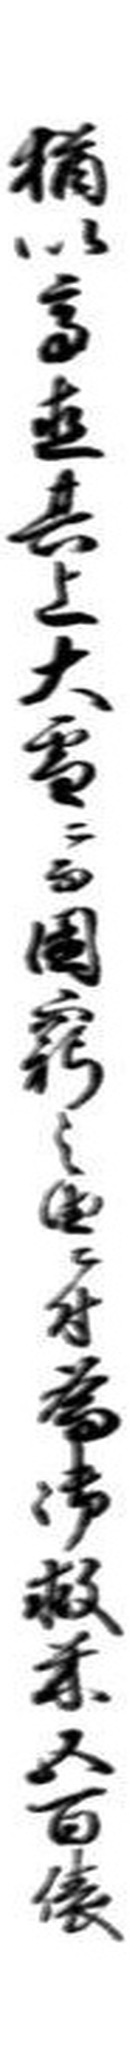猶以高直其上大雪ニ而困窮之由ニ付為御救米五百俵
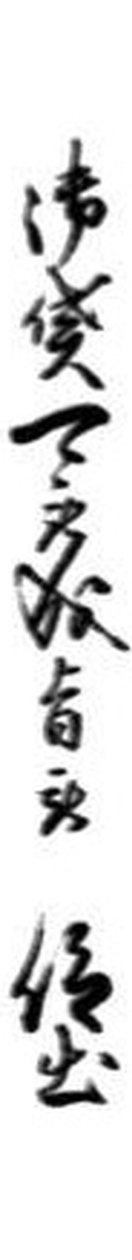御貸可被成旨被仰出
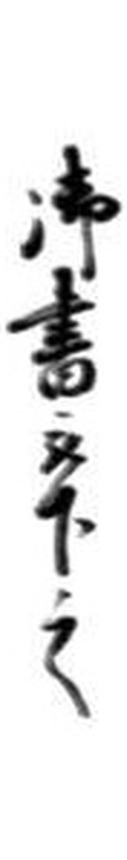御書被下之
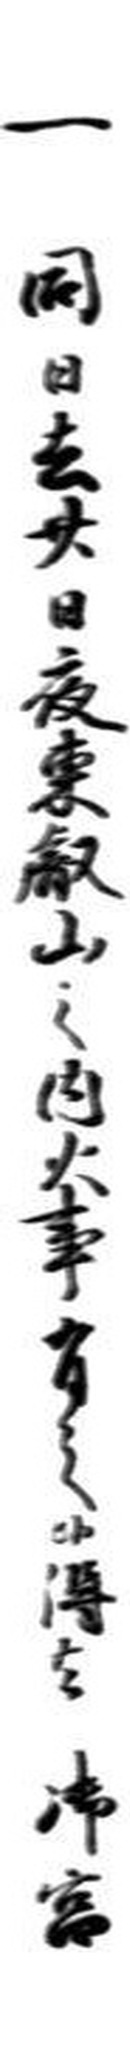一同日去廿日夜東叡山之内火事有之候得者御宮

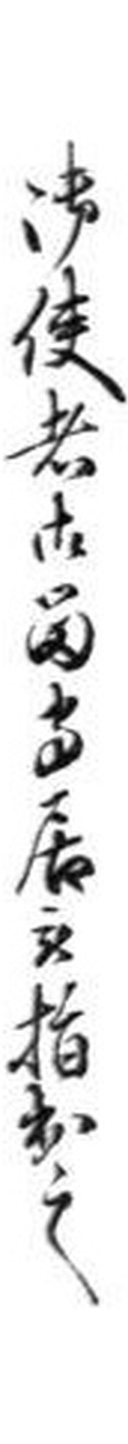御使者御留守居被指出之
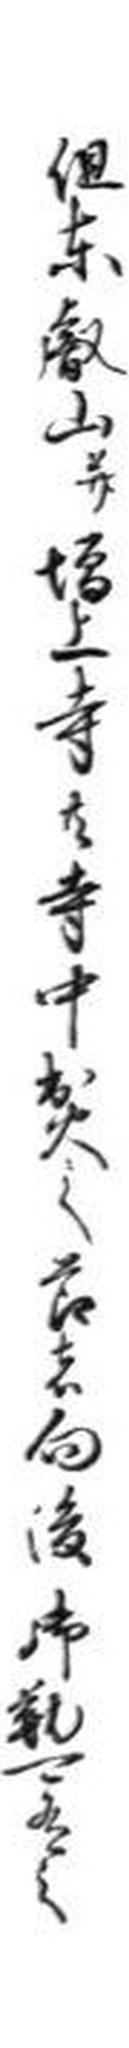但東叡山并増上寺共寺中出火之節者向後御勤可有之
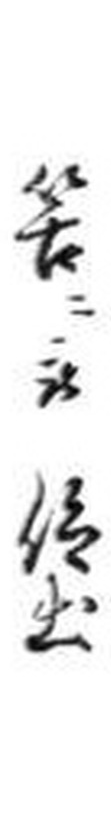筈ニ被仰出
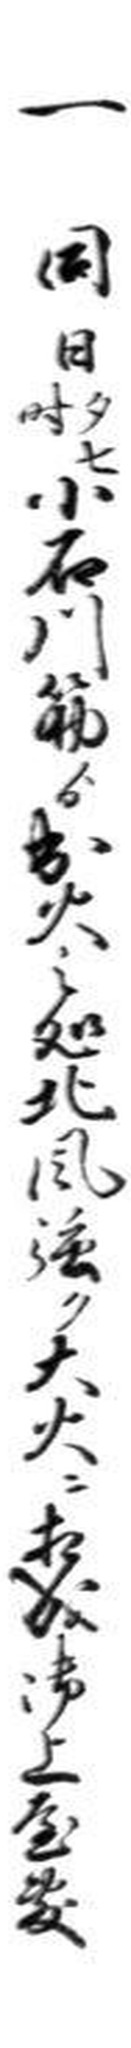時小石川筋ゟ出火之処北風強ク大火ニ相成御上屋敷
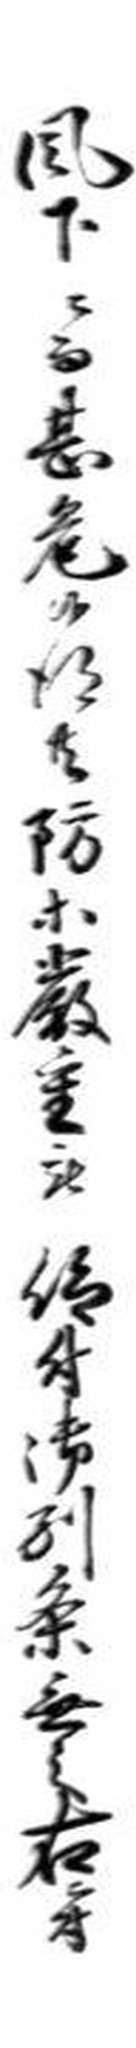風下ニ而甚危候得共防等厳重被仰付御別条無之右ニ付
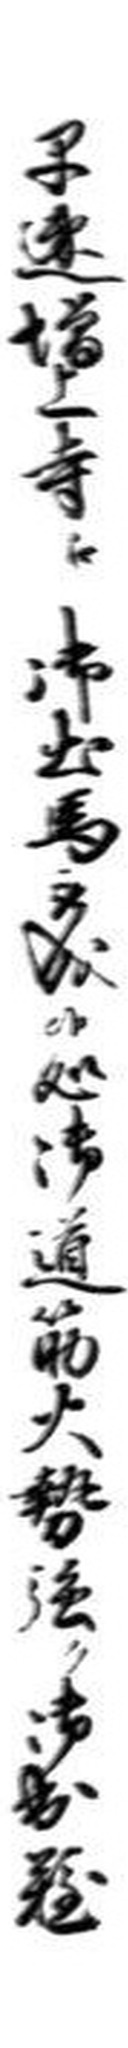早速増上寺江御出馬被成候処御道筋火勢強ク御出難
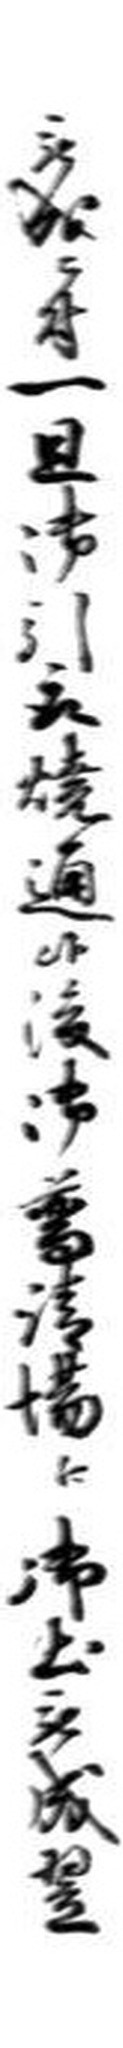被成ニ付一旦御引取焼通候後御普請場江御出被成翌
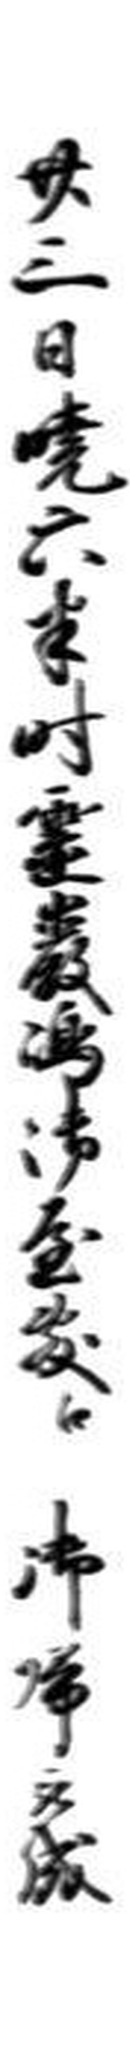廿三日暁六半時霊厳嶋御屋敷江御帰被成
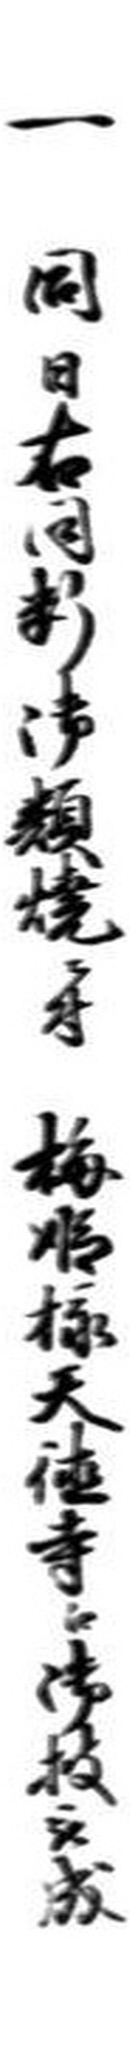一同日右同断御類焼ニ付梅姫様天徳寺江御披被成
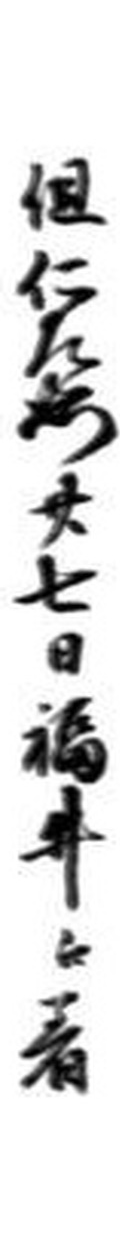但仁左衛門廿七日福井江着
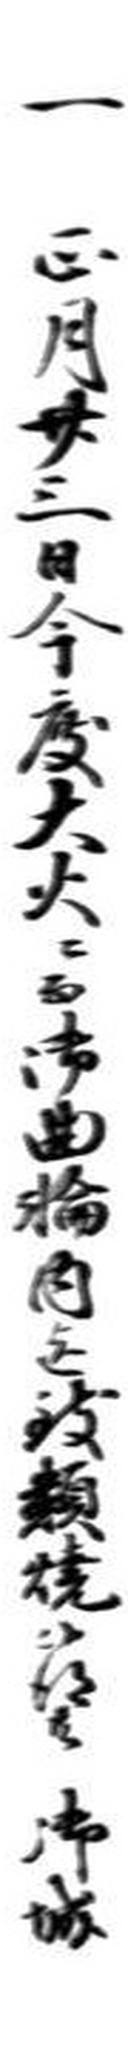一正月廿三日今度大火ニ而御曲輪内迄致類焼候得共御城
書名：家譜 三十二 吉邦公 従享保二年到享保三年
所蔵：福井県文書館 Fukui Prefectural Archives
